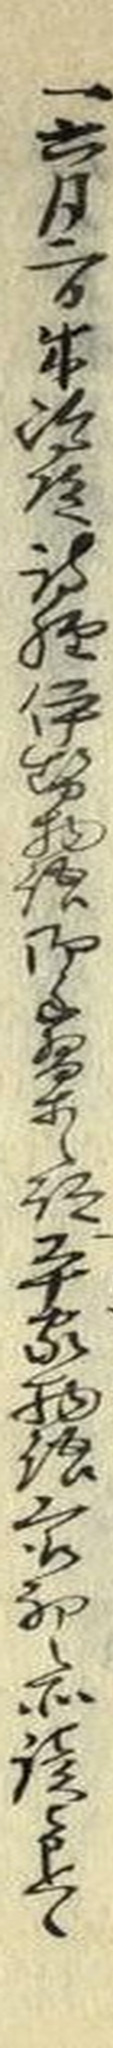一六月二日成嶋殿詩経伊勢物語御手習等之跡以後折々平家物語最初之所読被申上候
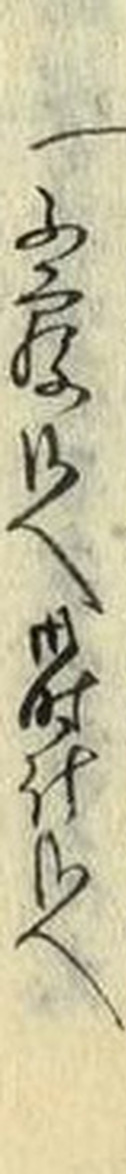不寝四人御時計弐人
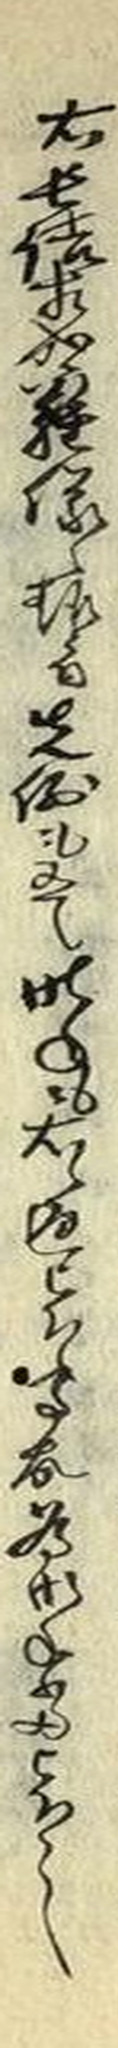右長詰相成御難儀之趣ニ付先例も有之昨年も右之通被下候事故為御手当被下
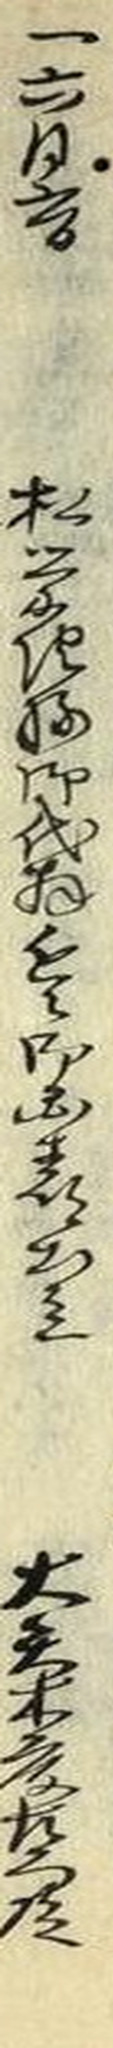一六月六日松栄院様御代拝近々御国表へ出立大矢木藤左衛門殿
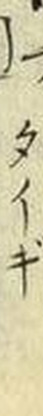タイギ
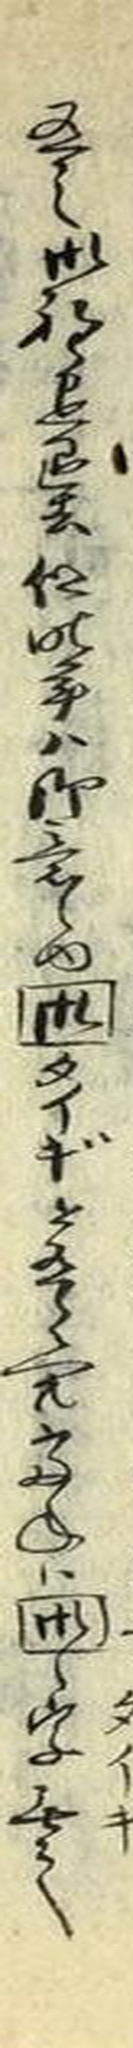有之御礼被申上退去但昨年ハ御意之内御タイギと有之候へ共当年ハ御之字無之
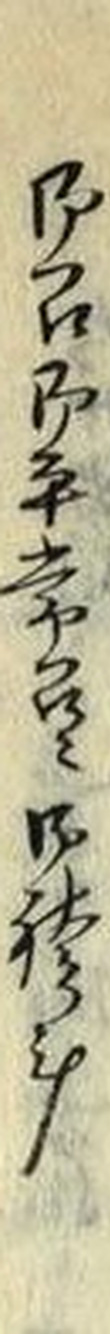御召御平常召ニ御袴斗
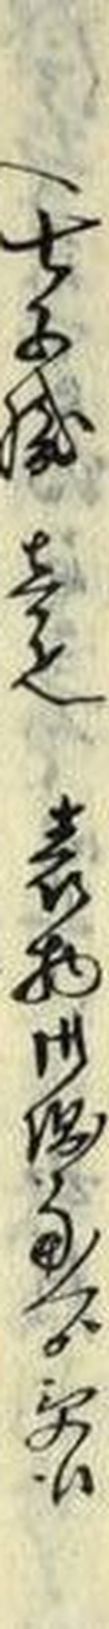七子織壱疋表物御側御用人ゟ受取
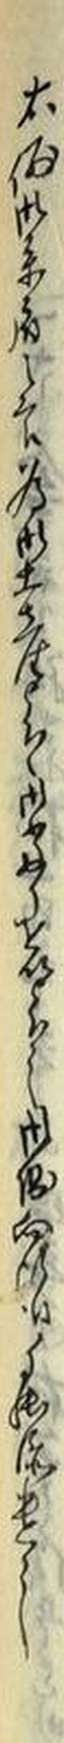右例御参府之節為御土産被下候御当りを以被下之御側向頭取手紙添遣之
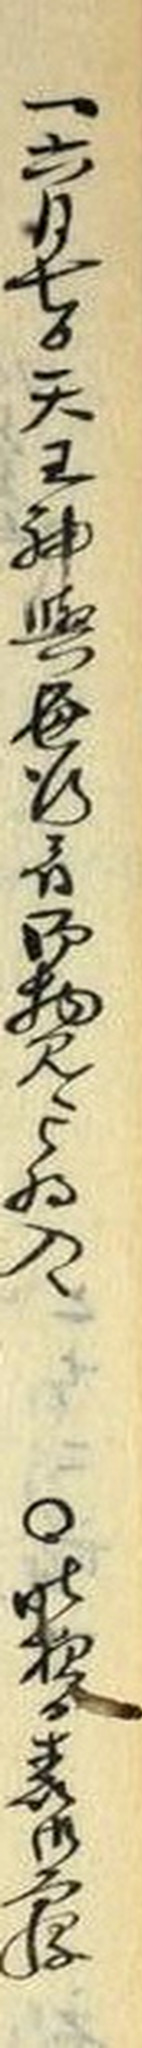一六月七日天王神輿通行ニ付御物見へ被為入候〇昨夜ゟ表御寝
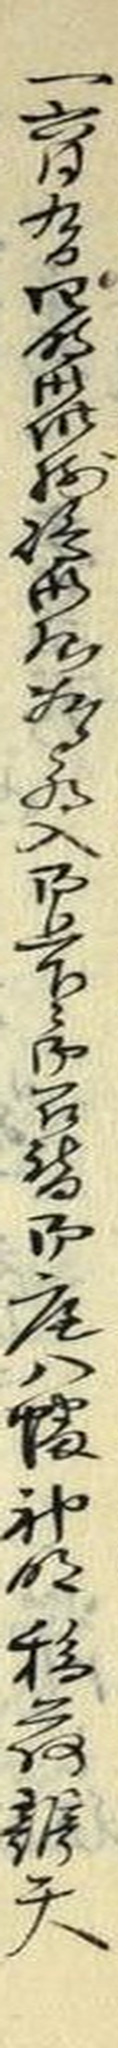一六月九日四時御供揃嶋御屋敷へ被為入御上下ニ御召替御庭八幡神明稲荷弁天
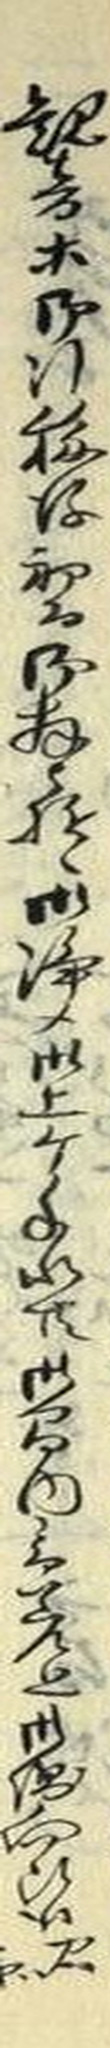観音等御引移後初而御拝被遊候御浄メ御上ケ手水共御間内ニ而差上御側向頭取忠兵衛
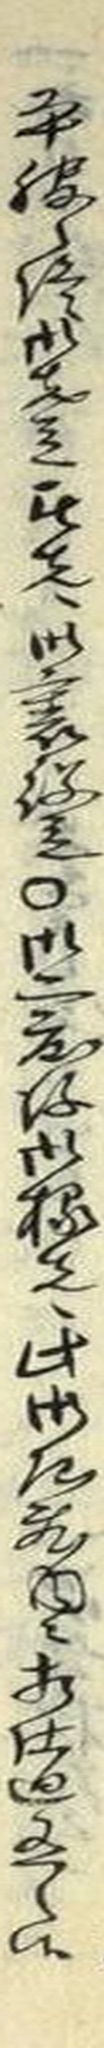平服之儘御先立其先へ御裏役立〇御二度後御縁先へ此御屋敷内ニ相仕廻有之候
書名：少傅日録抄（斉善付側向頭取日記、在府）
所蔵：福井県文書館 Fukui Prefectural Archives
